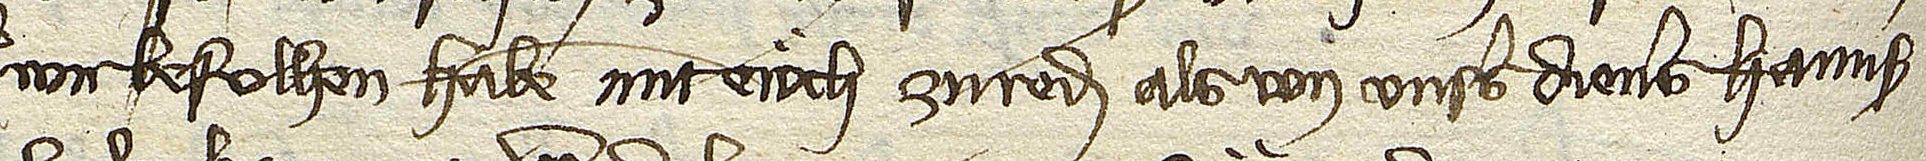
wir befolhen habe* mit eẅch ʒured* als von vnſ*s dien*s hannſ*
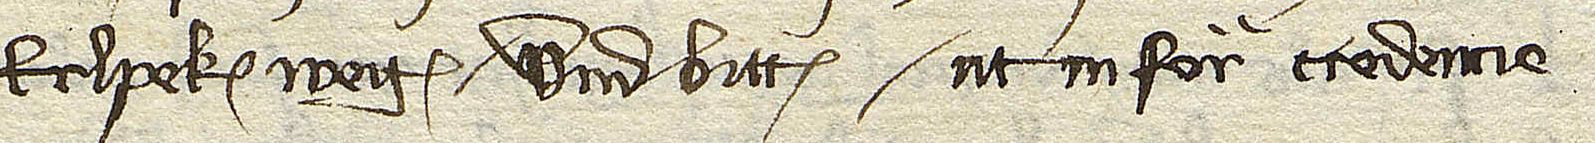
Erlpek* weg* / Vnd bitt* / ut in for* credencie
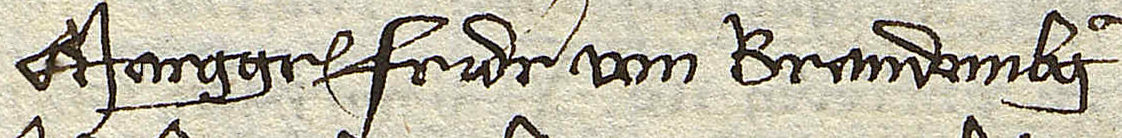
Marggrf* Fridr* von Brandemb*g
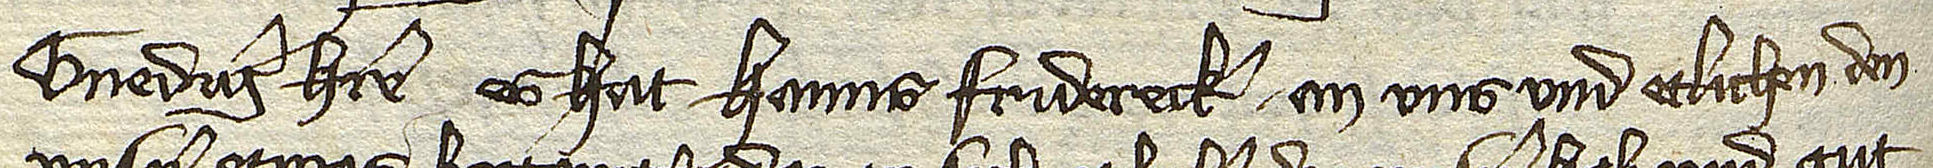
Gnedig* h*re es hat hanns fridereck* . an vns vnd etlichen den
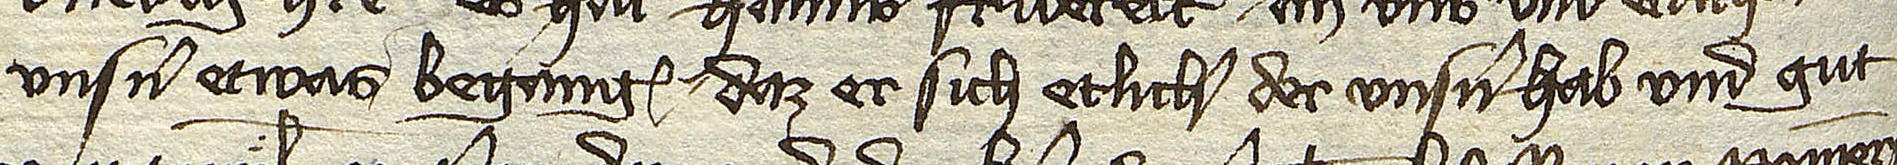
vnſ*n etwas begang* . daʒ er ſich etlich* der vnſ*n hab vnd gut
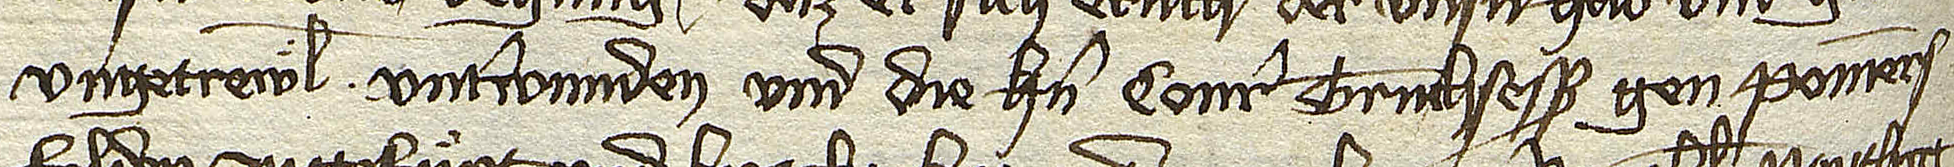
vngetreẅl* . vnt*wunden vnd die h*n Conr* Truchſeſſ* gen pomerſ =
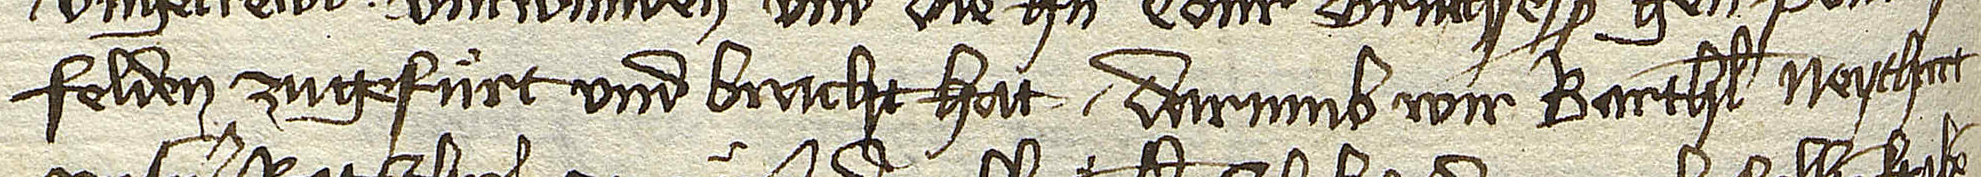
felden ʒugefürt vnd bracht hat / Darumb wir Barth*l Neythart
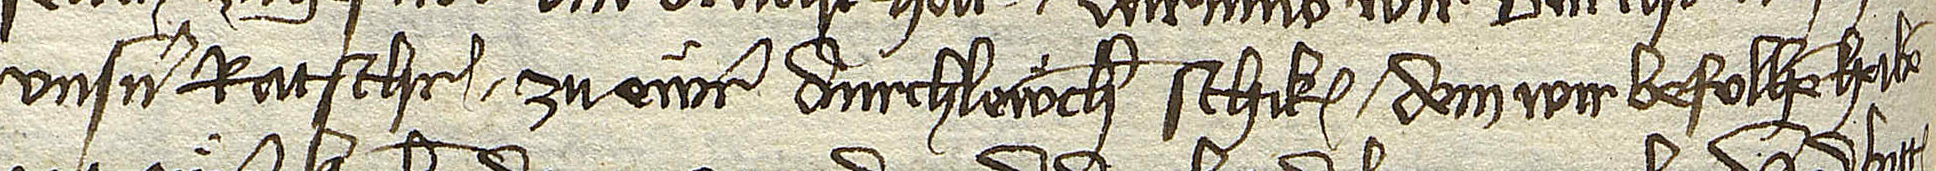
vnſ*n Ratſchr* / ʒu eẅr durchleẅch* ſchik* / dem wir befolhe* habe*
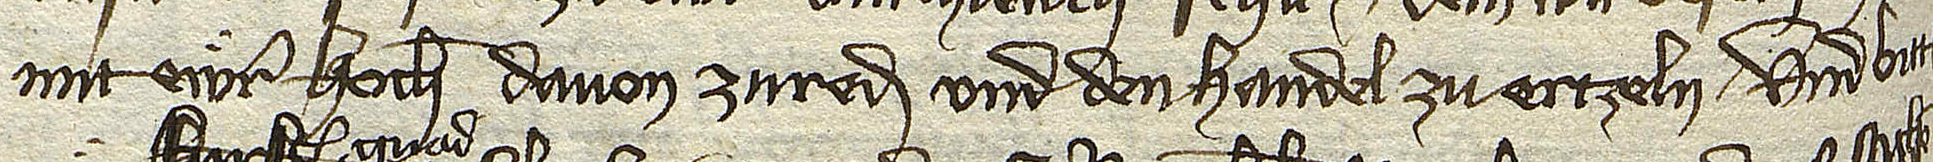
mit eẅr* hoch* dauon ʒured* vnd den handel ʒu ercʒeln / Vnd bitt*
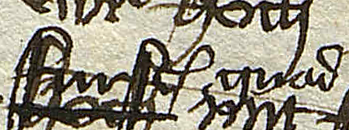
furſt* gnad
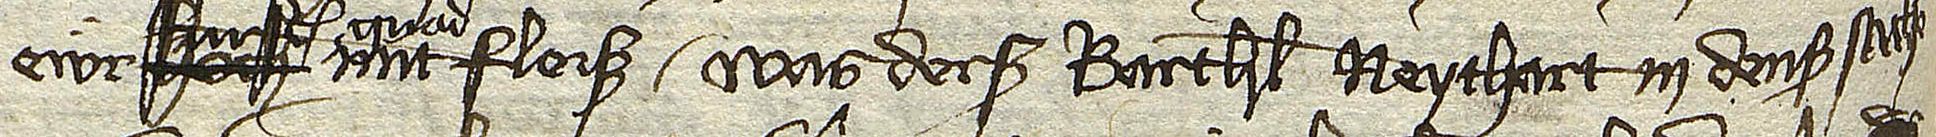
eẅr hoch* mit fleiſʒ / was derſ* Barth*l Neythart in denſ* ſache*
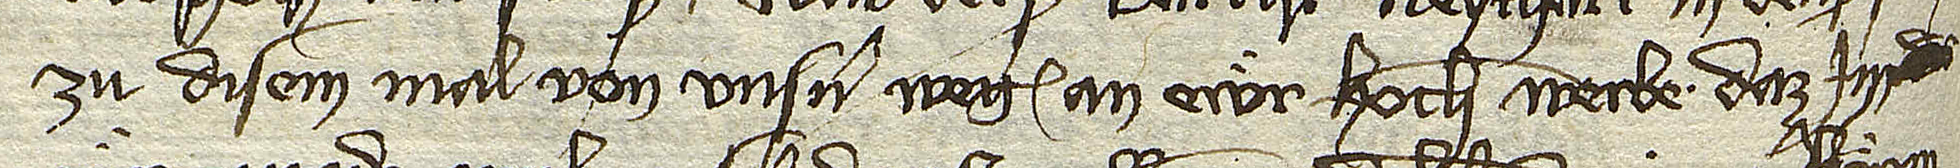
ʒu diſem mal von vnſ*n weg* an eẅr hoch* werbe . daʒ Im das
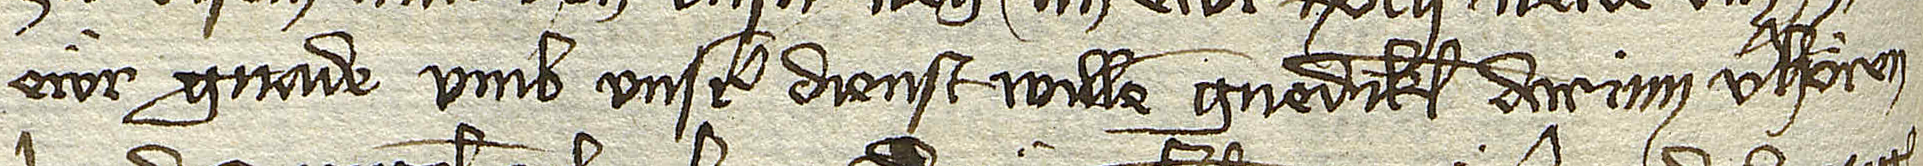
eẅr gnade vmb vnſ*r dienſt wille* gendikl* darinn v*hören
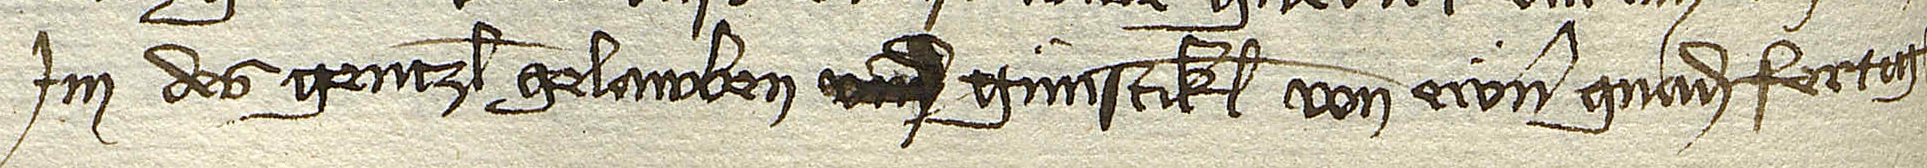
Im des gencʒl* gelawben vnd günſtikl* eẅn* gnad* fertig*
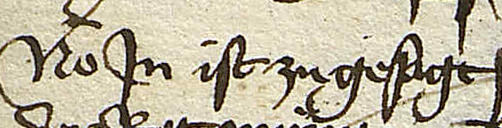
No* In iſt ʒu geſagt
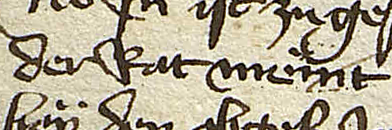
der Rat meint
